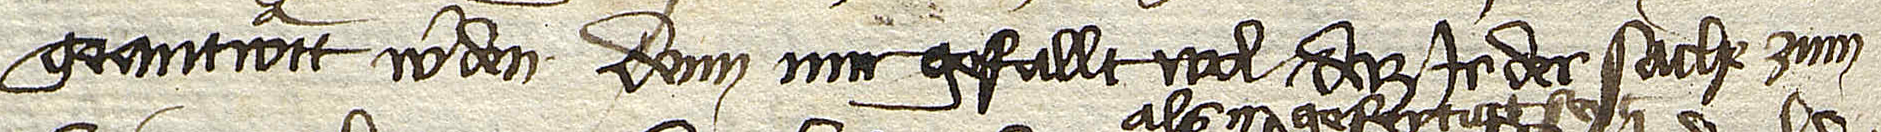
geantw*tt w*den . Den mir gefallt wol / daʒ Ir der ſache ʒum
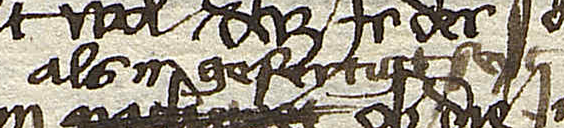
als ir gefertigt ſeyt
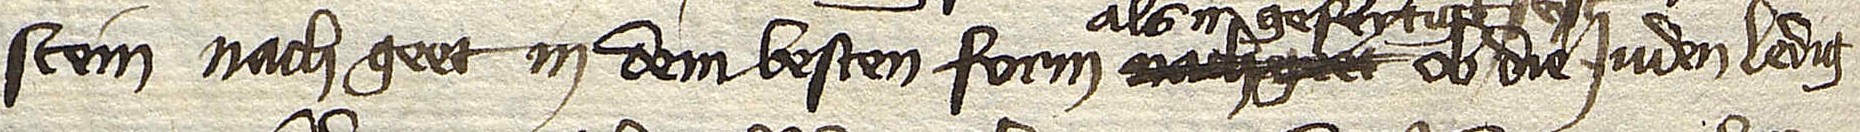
ſtein nach geet in dem beſten form nachgeet ob die Iuden ledig
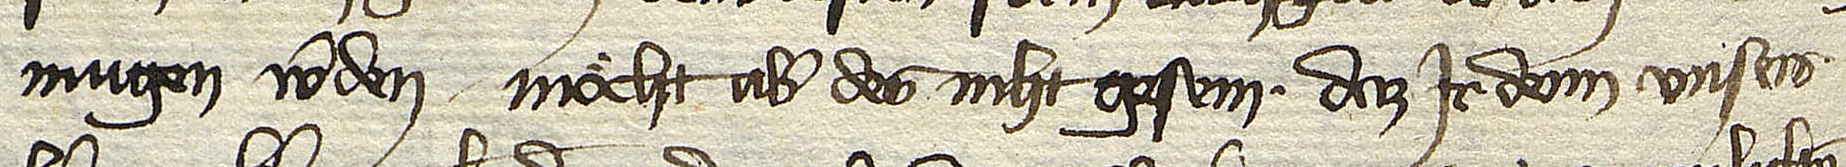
mugen w*den / möcht ab* des niht geſein . daʒ Ir denn vnſers
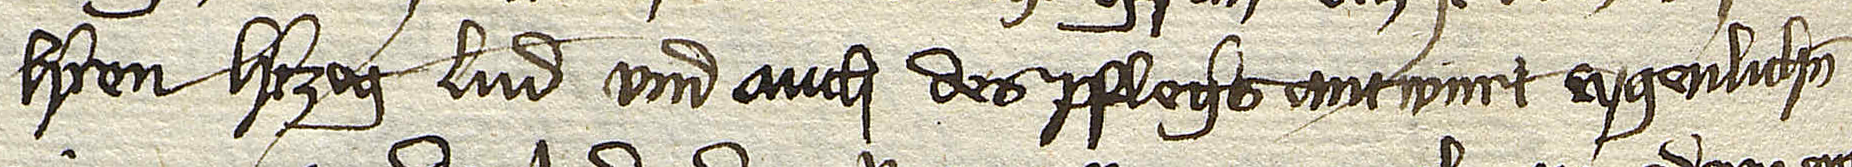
h*ren h*cʒog lud* vnd auch des pfleg*s antwurt eygenlichn*
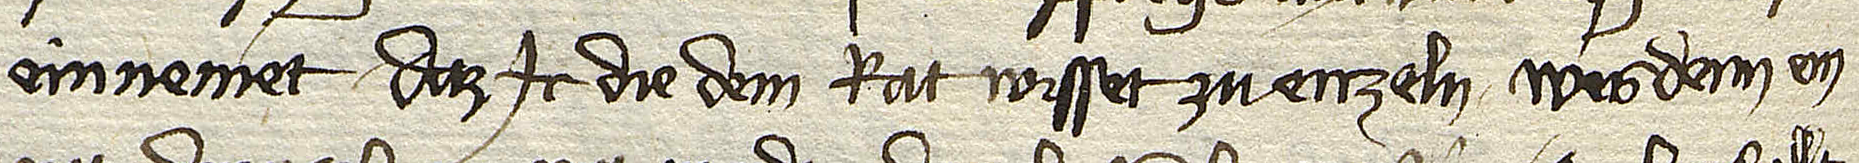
einnemet / daʒ Ir die dem Rat wiſſet ʒu ercʒeln / wes denn ein
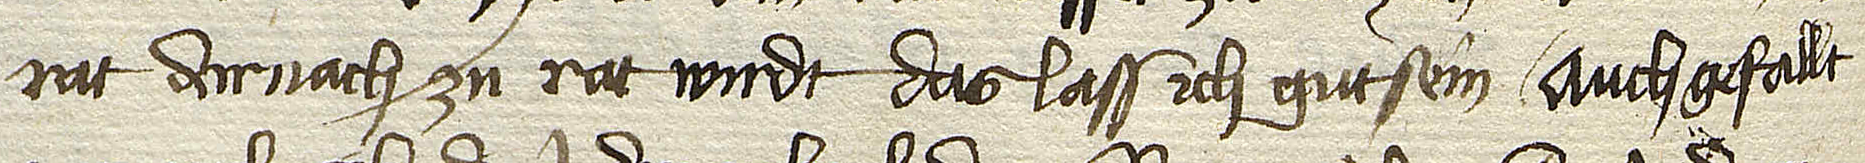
rat darnach ʒu rat wirdt das laſſ ich gut ſein / Auch gefallt
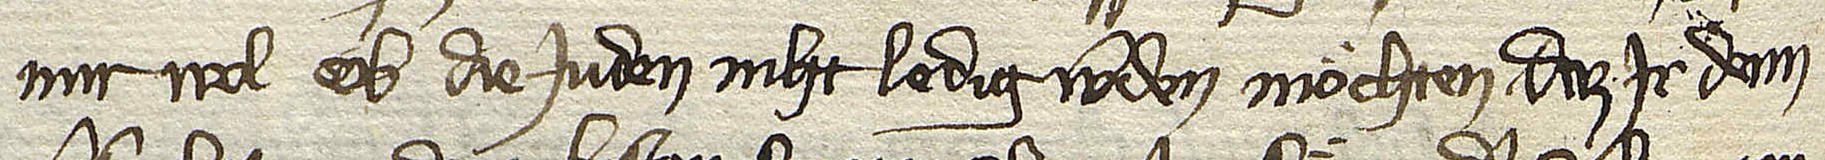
mir wol Ob die Iuden niht ledig w*den möchten / daʒ Ir denn
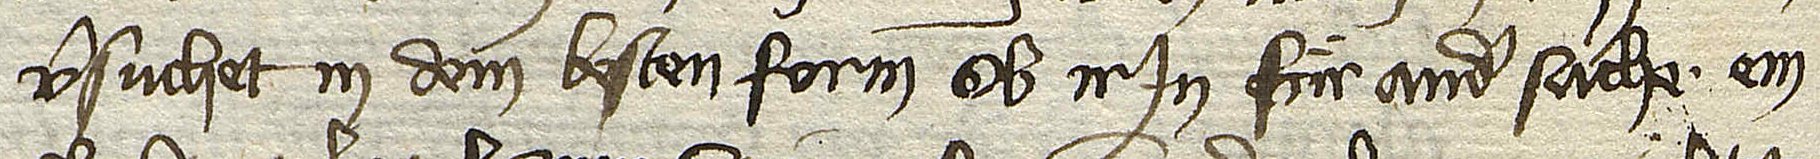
v*ſuchet in dem beſten form Ob ir In für and* ſache . ein
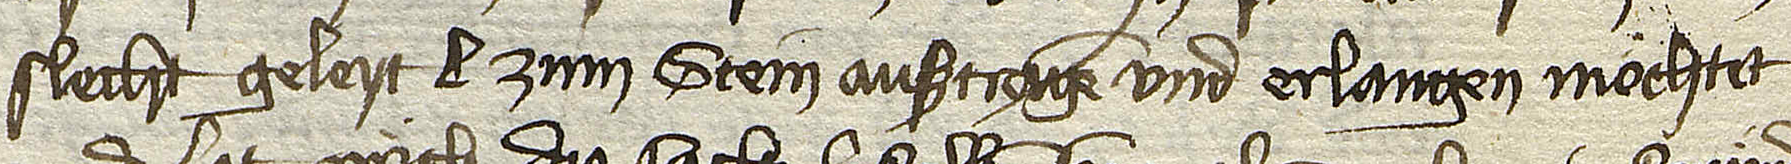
ſlecht geleyt l ʒum Stein auſʒtrage* vnd erlangen möchtet
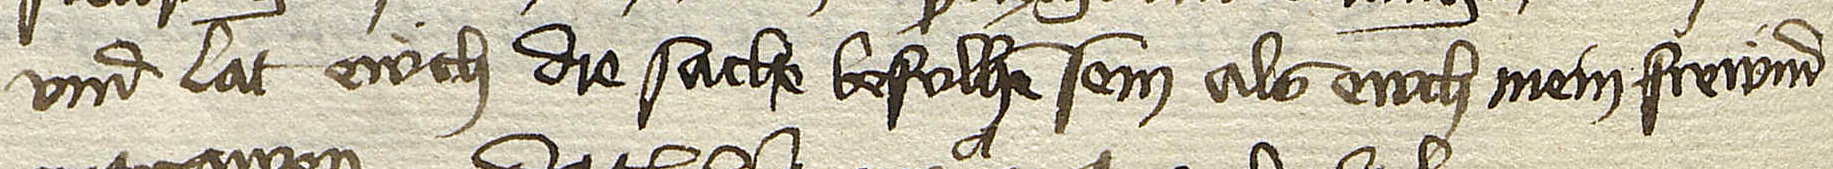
vnd lat eẅch die ſache befolhe* ſein als ewch mein freẅnd
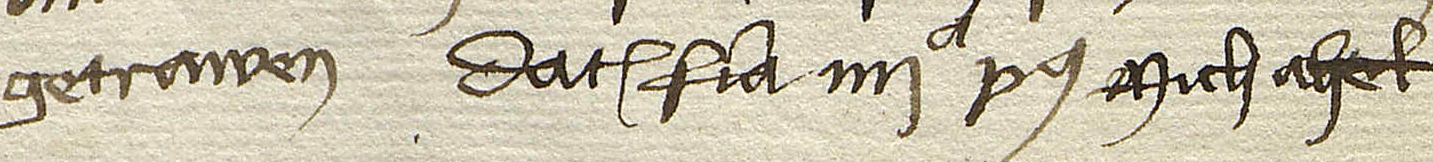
getrawen Dat* fi*a iiii* p* Michahel*
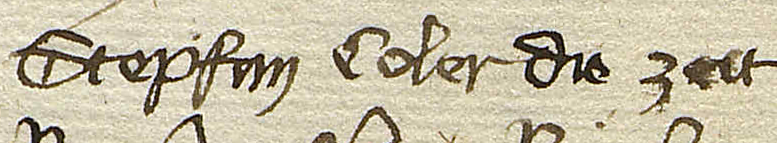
Stepfan Coler die ʒeit
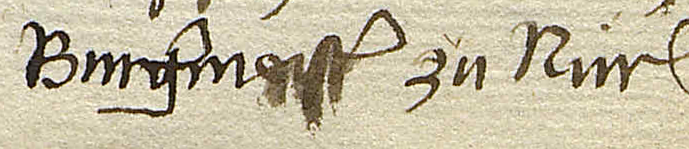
Burg*meiſt* ʒu Nür*
